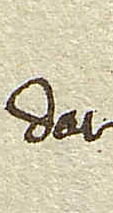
dar*
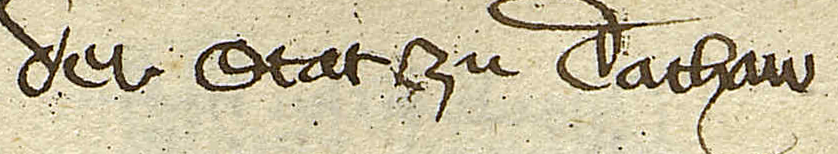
der Stat cʒu Tachaw
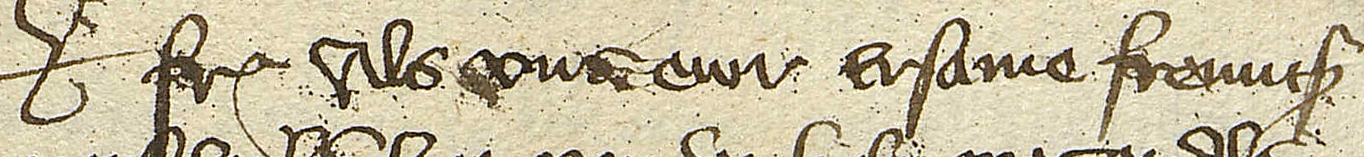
L* fr* Als vns ewr Erſame freuntſ*
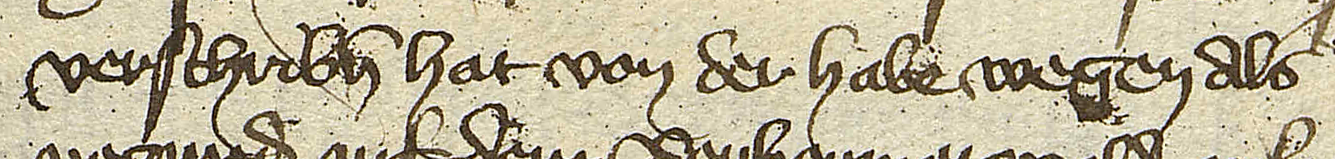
verſchribn* hat von der habe wegen Als
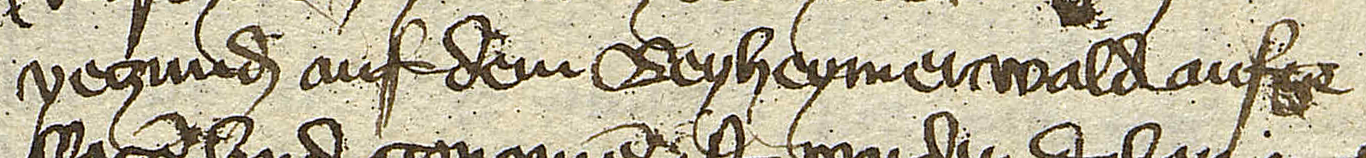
yecʒund* auf dem Beyheymerwald aufge
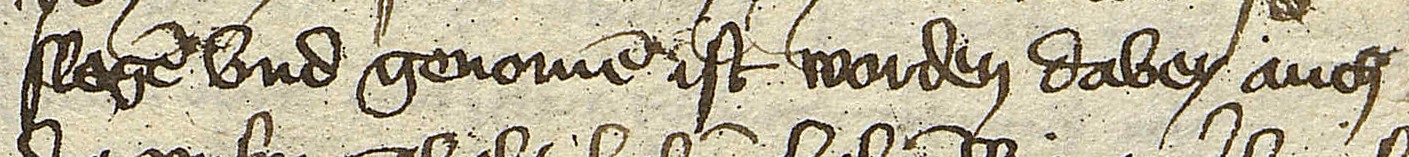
ſlage* vnd genome* iſt worden dabey auch
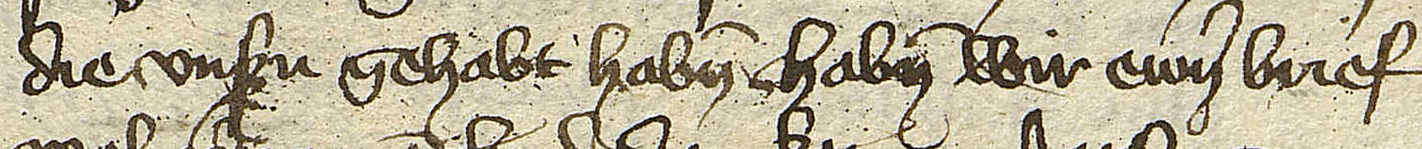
die vnſ*n gehabt habn* / habn* wir ewn* brief
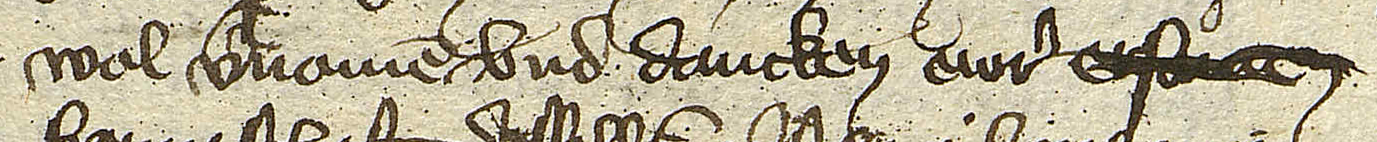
wol v*nome* / vnd dancken ewr* erſam*
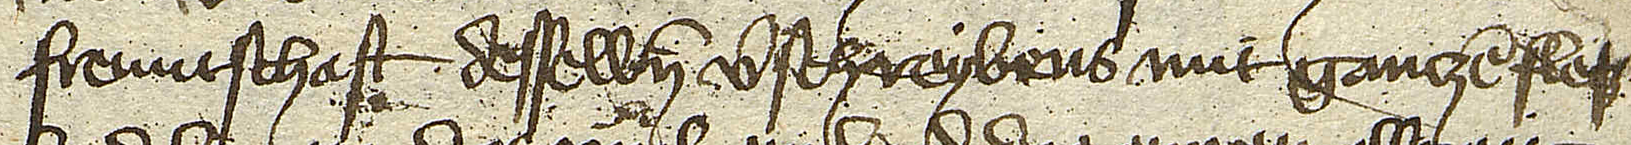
freuntſchaft deſſelbn* v*ſchreybens mit gancʒe* fleiſʒ
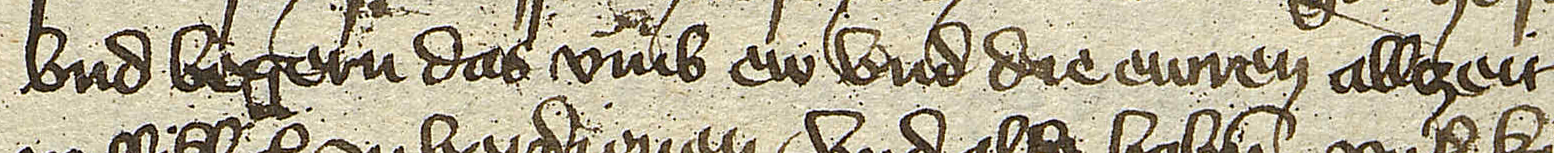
vnd begern das v̈mb ew vnd die ewren allcʒeit
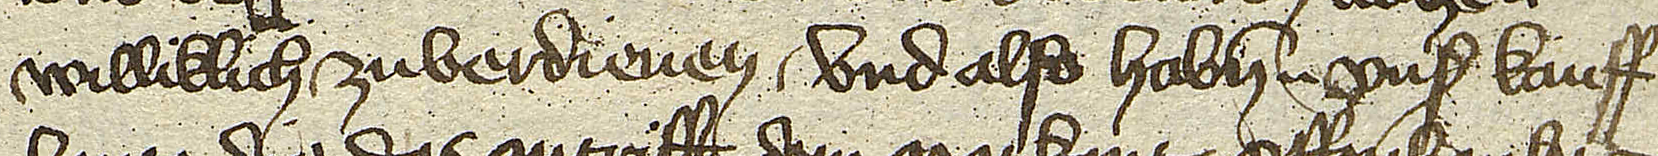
williklich cʒuverdienen / vnd alſo habn* ~ vnſ* kauff
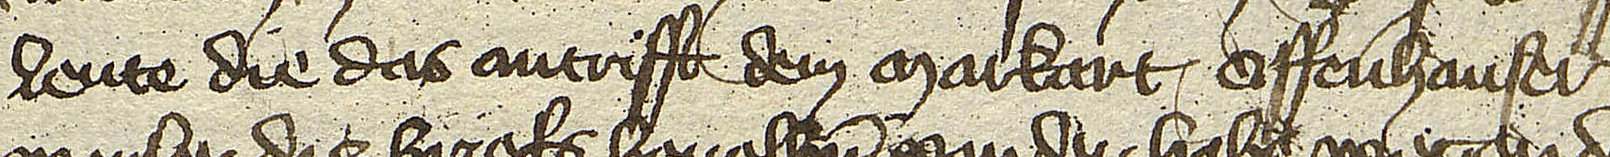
leute die das antriffr dem Markart Offenhauſer
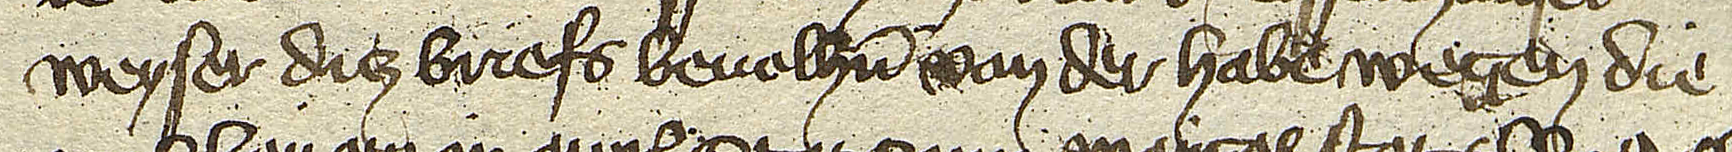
weyſer dicʒ briefs beuolhn* von der habe wegen die
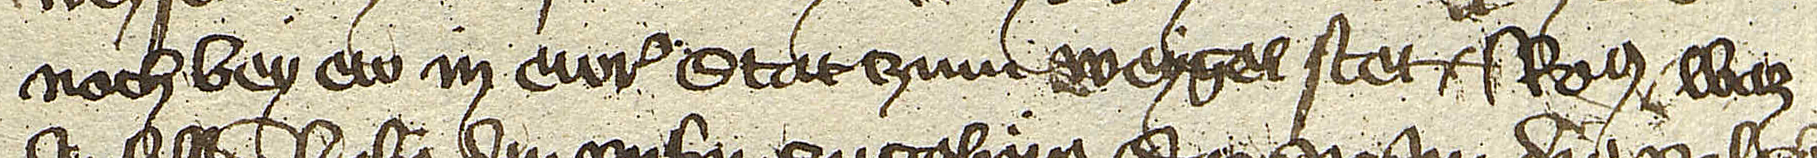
noch bey ew in ewr* Stat cʒum weygel ſtet / Ro* / waʒ
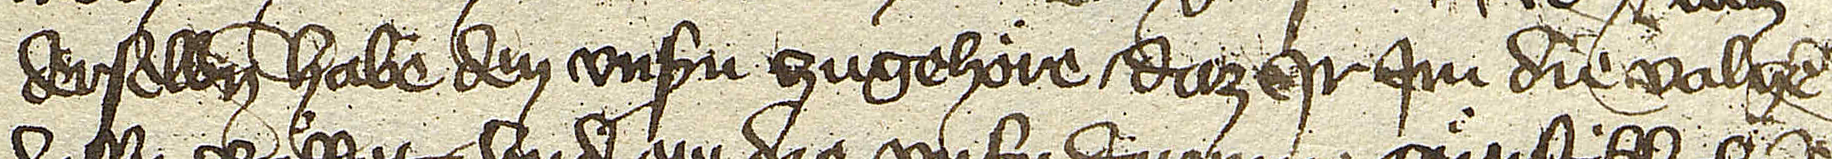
derſelbn* habe den vnſ*n cʒugehöre / daʒ Ir Im die volge*
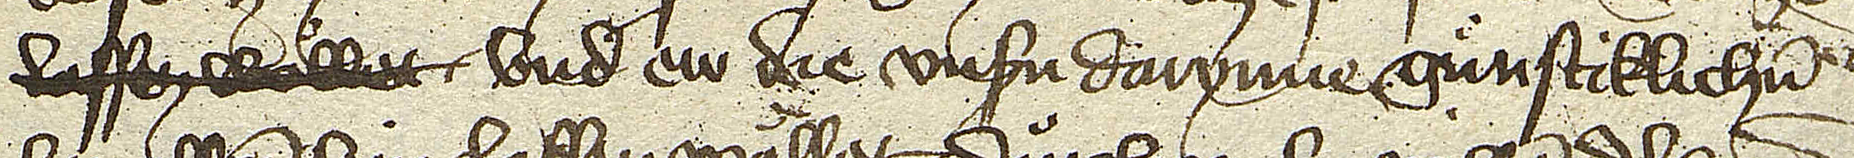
laſſen wöllet / vnd ew die vnſ*n darynne günſtiklichn*
